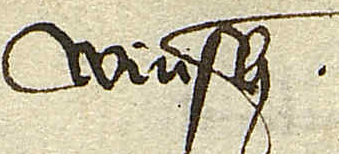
winſh*
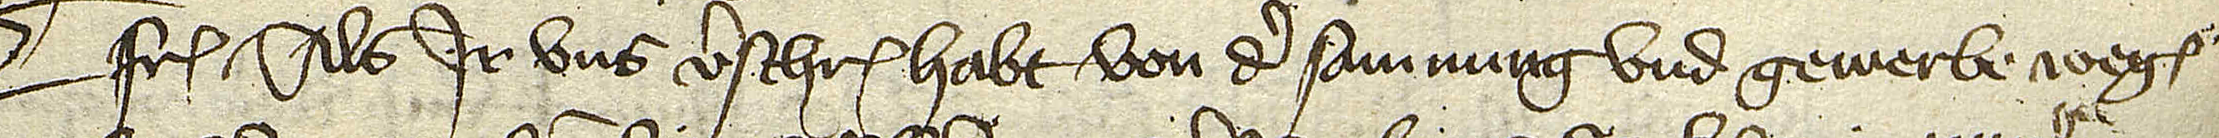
L* fr* / Als Ir vns v*ſchr* habt / von d* ſamnung vnd gewerbe weg*
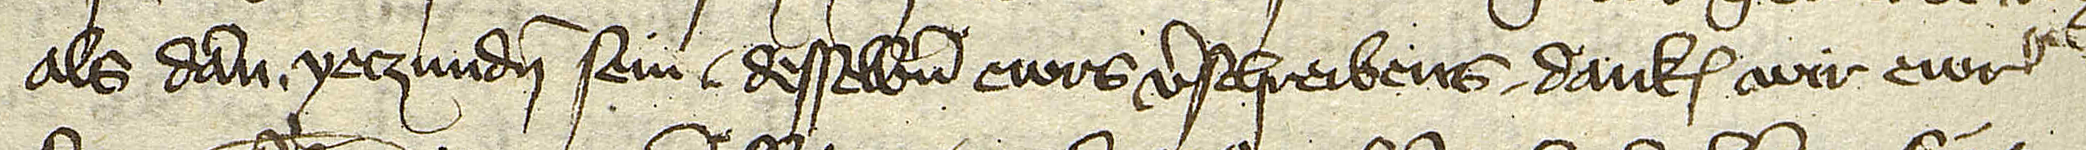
als dan* yecʒundn* ſein / deſſelbn* ewrs v*ſchreibens / dank* wir ewr*
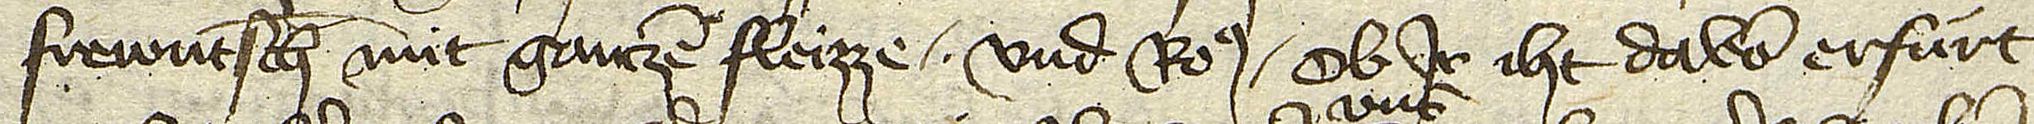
frewntſch* mit gancʒe* fleiʒʒe / . vnd Ro* / Ob Ir iht davo* erfürt
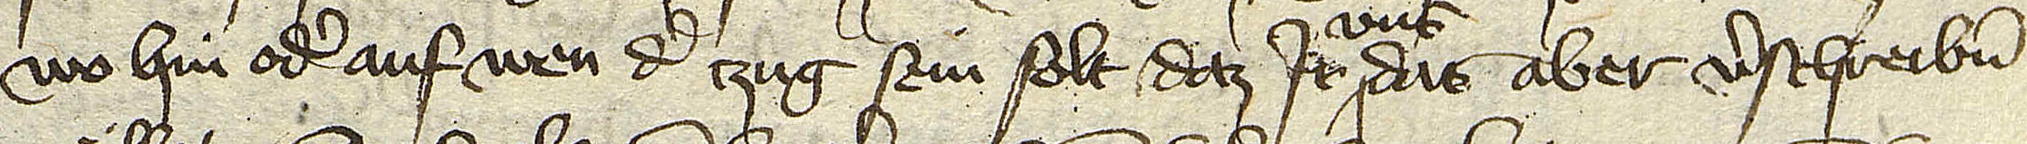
wo hin od* auf wen d* cʒug ſein ſolt / daʒ Ir das aber v*ſchreibn*
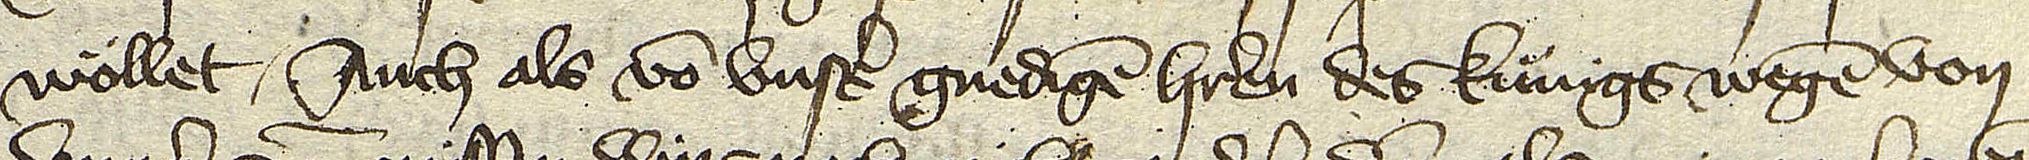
wöllet / Auch als vo* vnſs* gnedige* hr*en des künigs wege* von
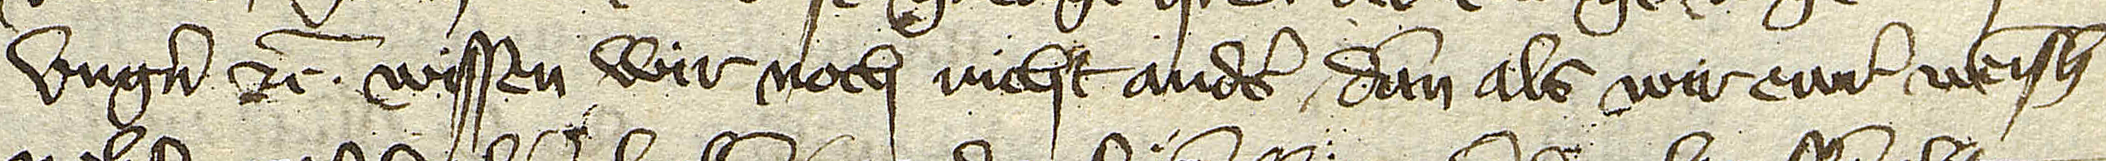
Vngn* ec* . wiſſen wir noch nicht ands* / dan* als wir ewr* weiſh*
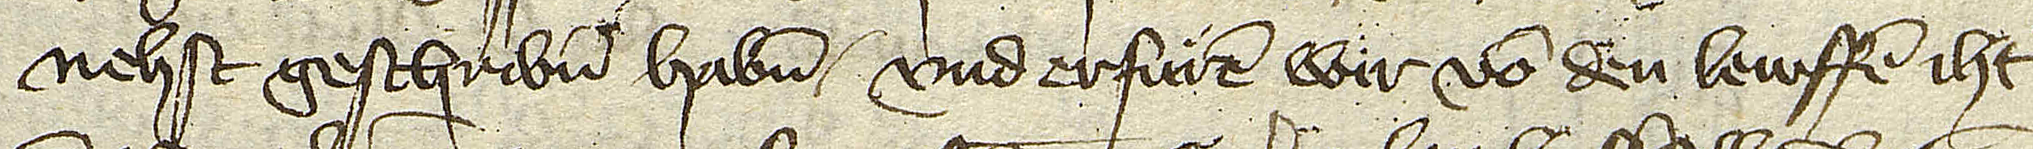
nehſt geſchribn* habn* / vnd erfüre* wir vo* den lewffe* iht
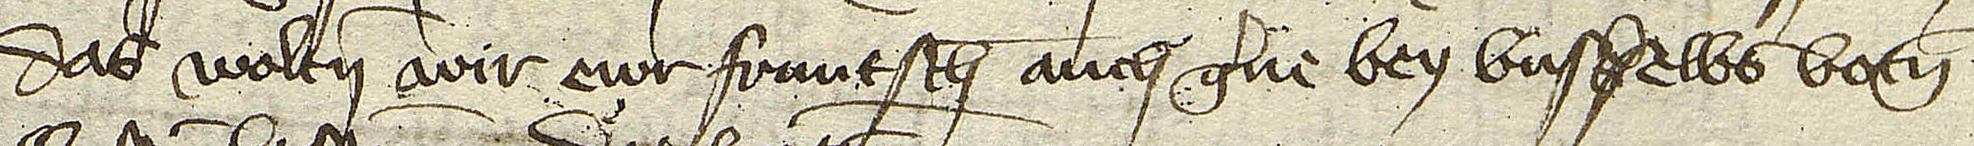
das woltn* wir ewr fruntſch* auch g*ne bey vnſſelbs botn*
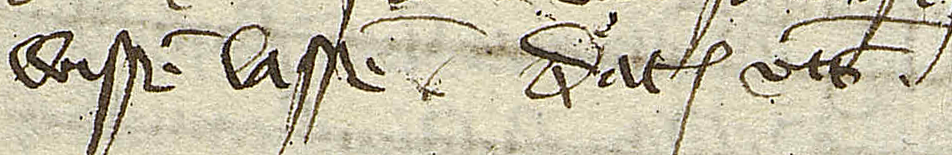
wiſſe* laſſe* / Dat* vts* .
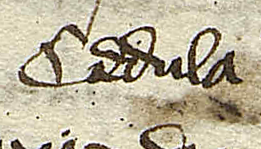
Cedula
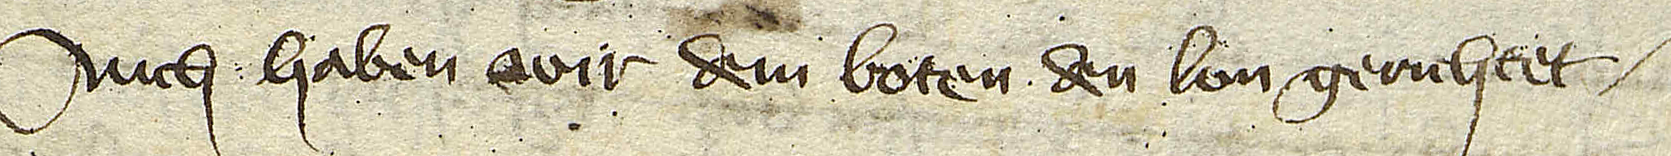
Auch haben wir dem boten den lon gerichtet /
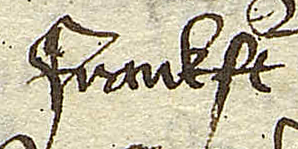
Frankf*t
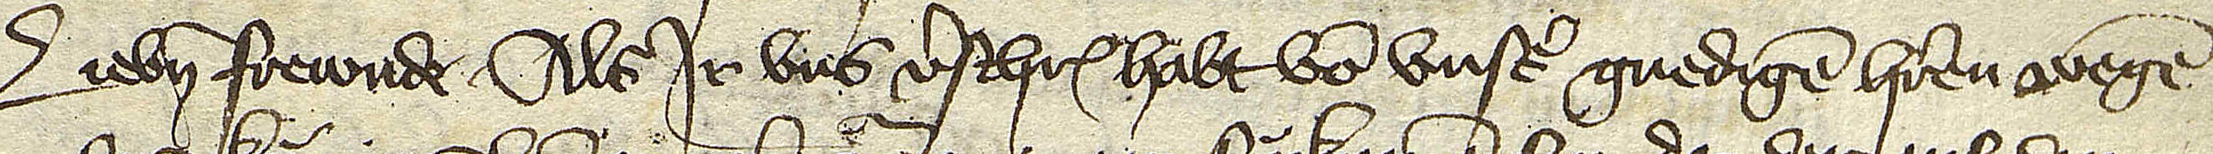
Liebn* frewnde / Als Ir vns v*ſchr* habt vo* vnſs* gnedige* hr*en wege*
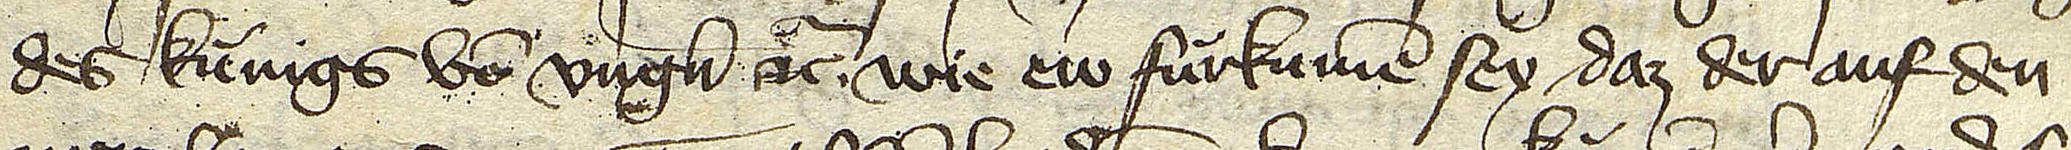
des künigs vo* vngn* ec* wie ew fürkume* ſey / daʒ der auf den
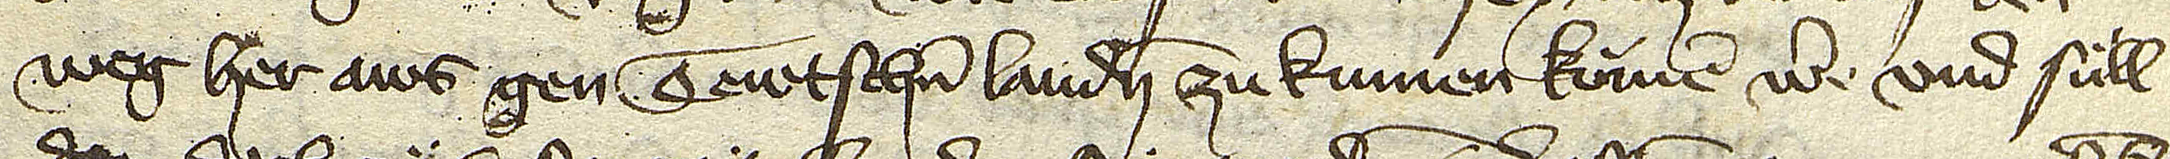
weg her was gen Tewtſchn* landn* cʒu kumen köme* w*e vnd ſüll
